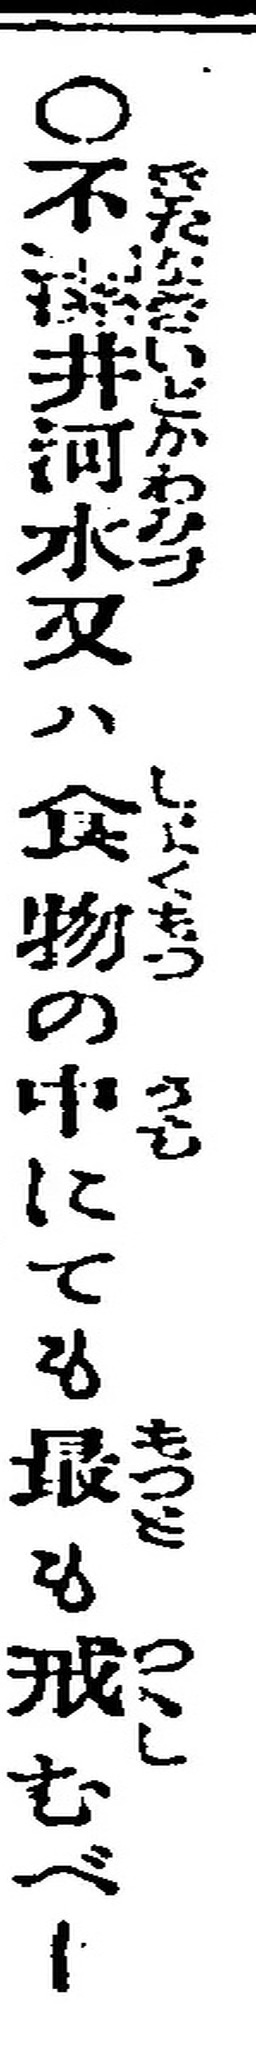〇不潔井河水又は食物の中にてももっと最も戒むべし
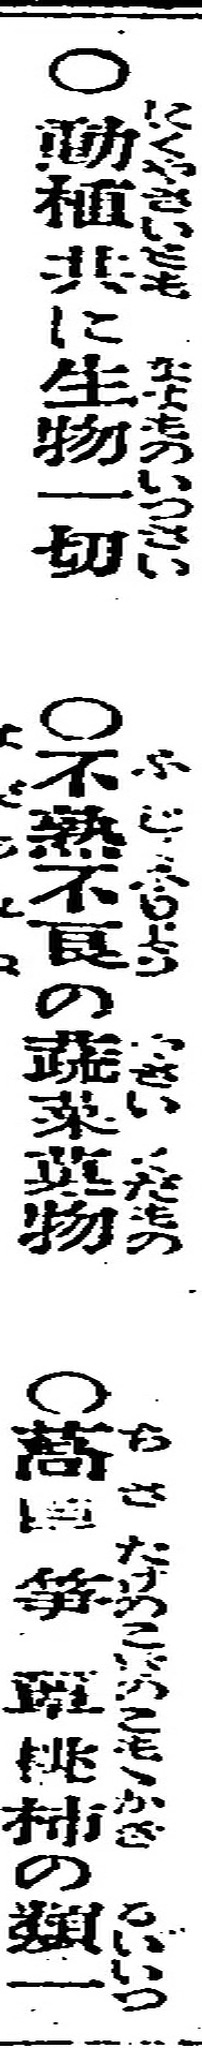〇動植共に生物一切〇不熟不良の蔬菜果物〇萵巨笋箪柿の類一
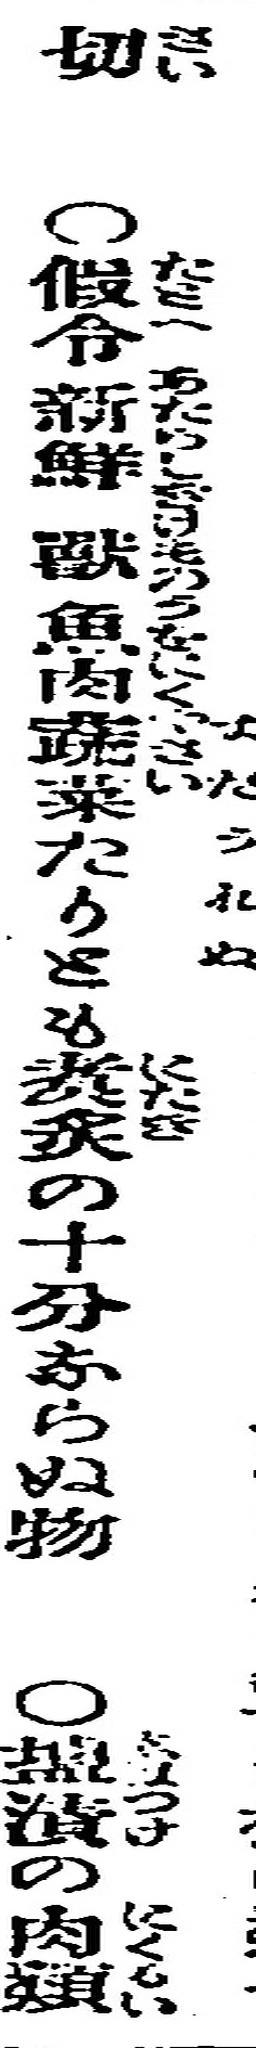切〇假令新鮮獣魚肉蔬菜たりとも煑炙の十分ならぬ物〇䀋漬の肉類
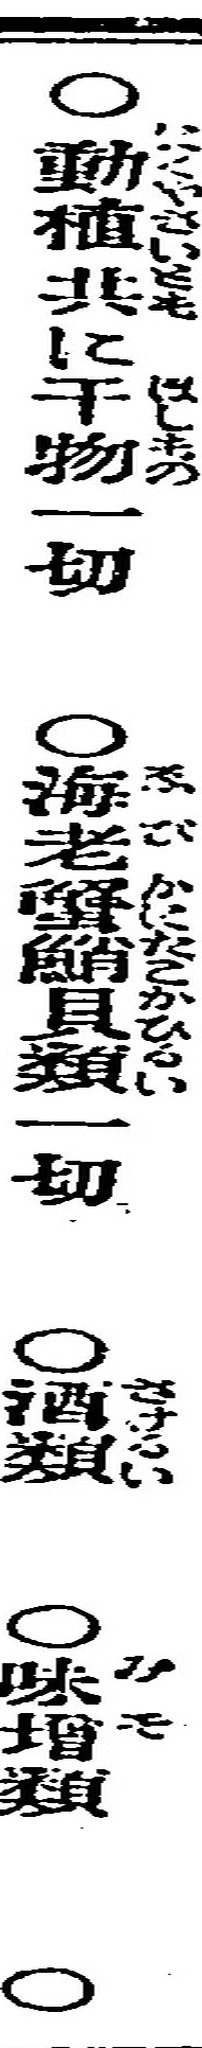〇動植共に干物いっさ一切〇海老蟹蛸貝類一切〇酒類〇味噌類〇
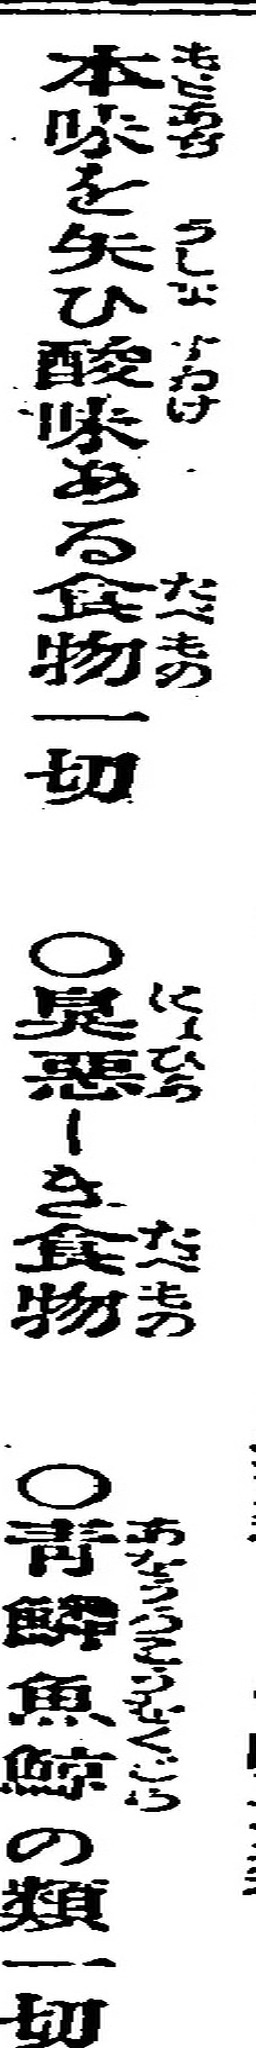本味を失ひ酸味ある食物一切〇臭惡しき食物〇青鱗魚鯨の類一切

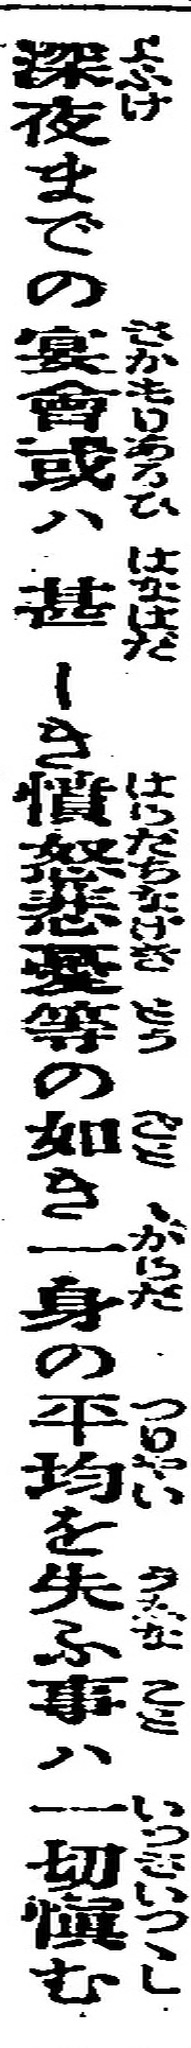深夜までの宴會或は甚しき憤怒悲憂等の如き一身の平均を失ふ事は一切慎む
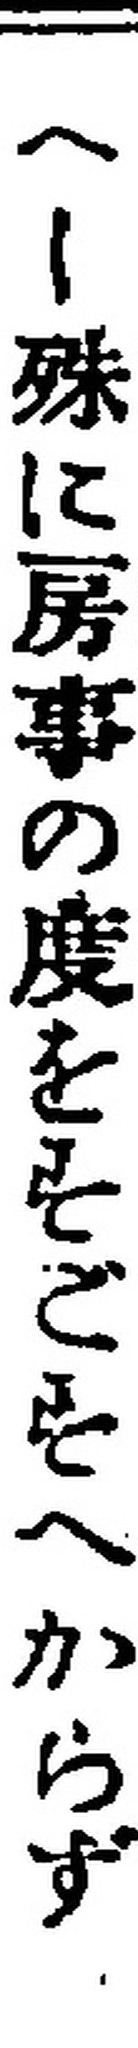へし殊に房時の度をすごすへからず
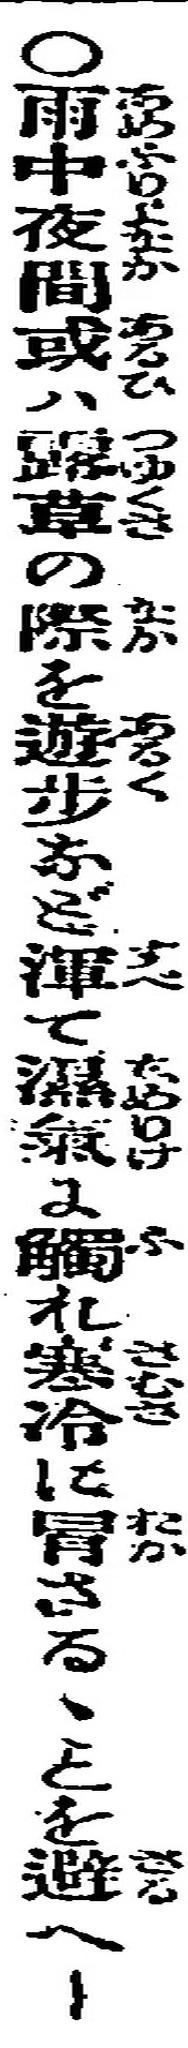〇雨中夜間或は露草の際を遊歩など濕氣に觸れ寒冷に冒さるゝことを避へし
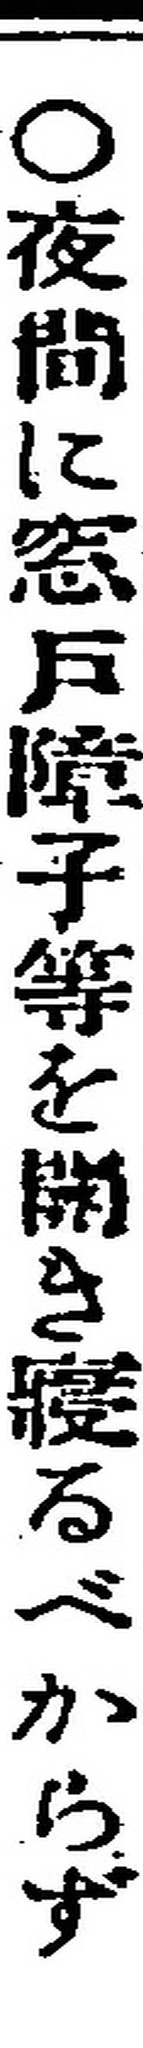〇夜間に窓戸障子等を開き寝るべからず
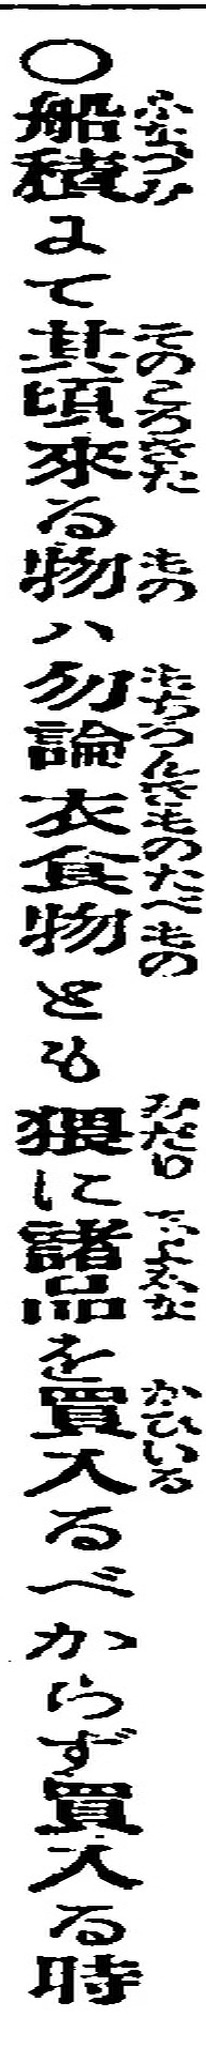〇船積にて其頃來る物は勿論衣食物とも猥に諸品を買入るべからず買入る時
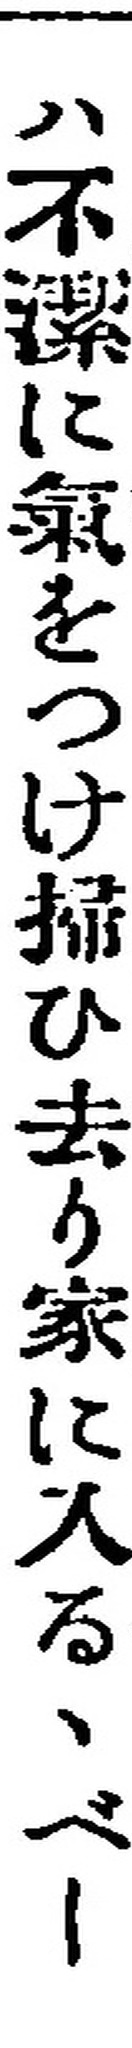は不潔に氣をつけ掃ひ去り家に入るゝべし
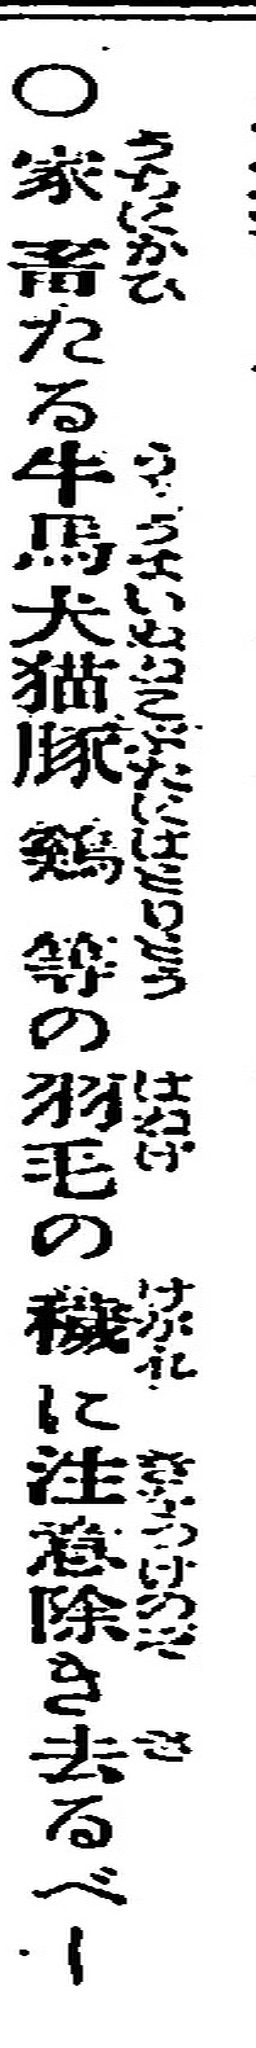〇家畜たる牛馬犬猫豚鶏等の羽毛の穢に注意除き去るべし
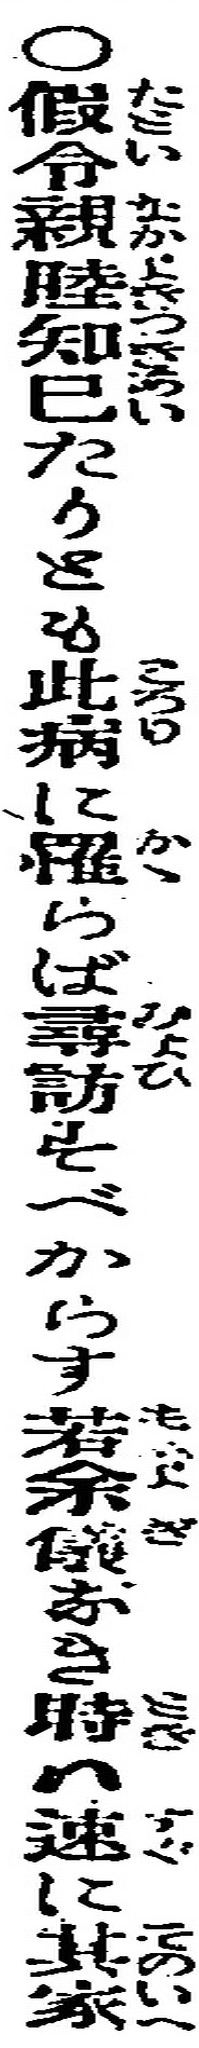〇假令親睦知巳たりとも此病に罹らば尋訪すべから若余儀なき時は速に其家
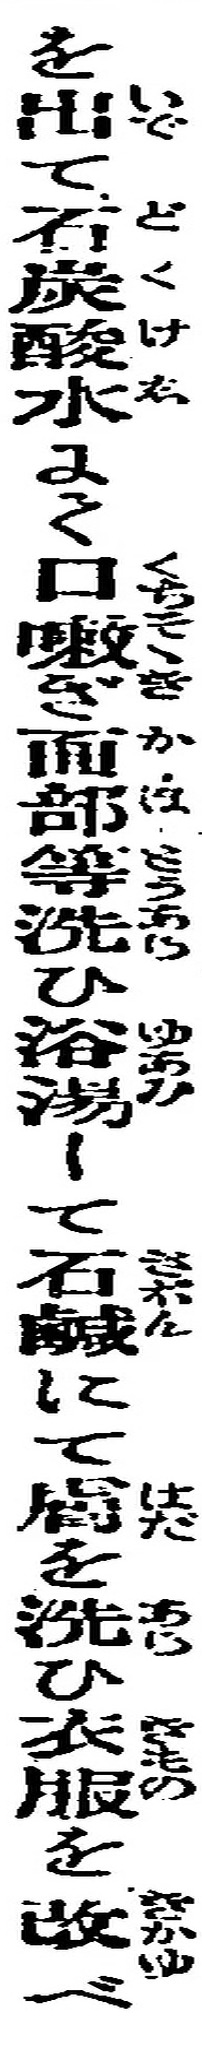を出て石炭酸水にて口嗽ぎ面部部等洗ひ浴湯して石鹸にて膚を洗ひ衣服を改べ
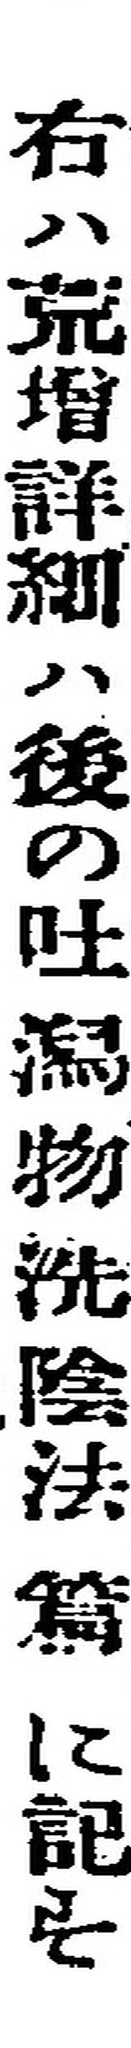右は荒増詳細は後の吐瀉物洗陰[除]法篇に記す

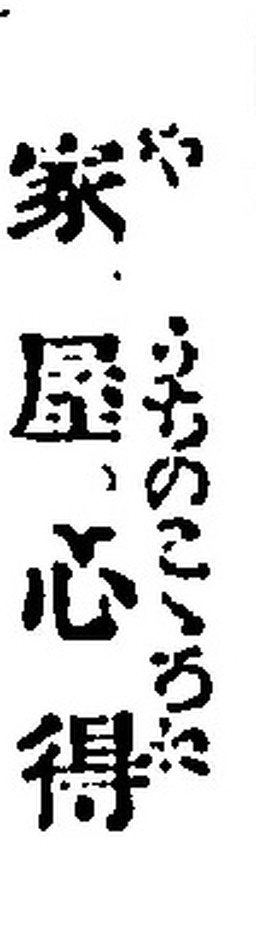家屋心得
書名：虎列剌病予防養生法訳解
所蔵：国立国会図書館 National Diet Library, JAPAN
